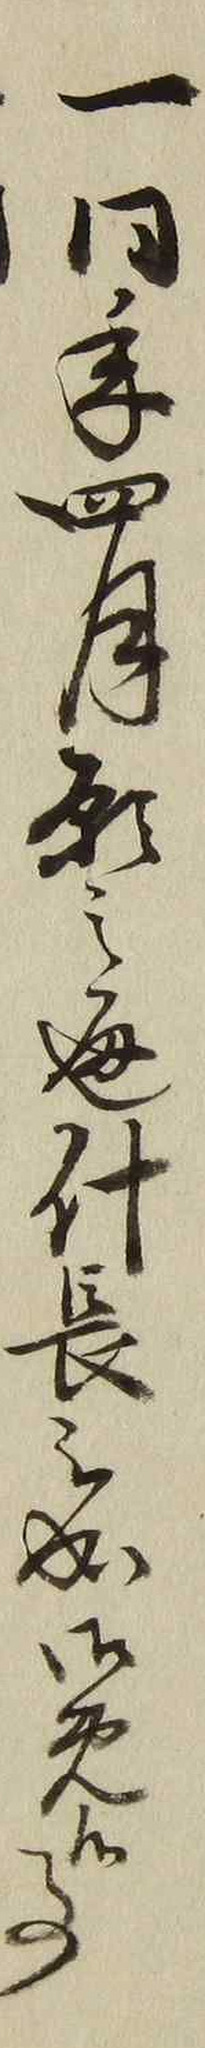一同年四月願之通什長被成御免候事
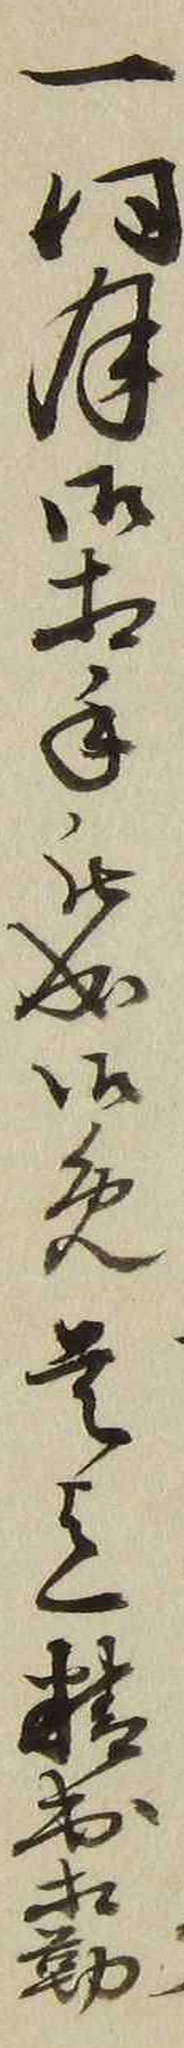一同月御相手被成御免是迄精出相勤
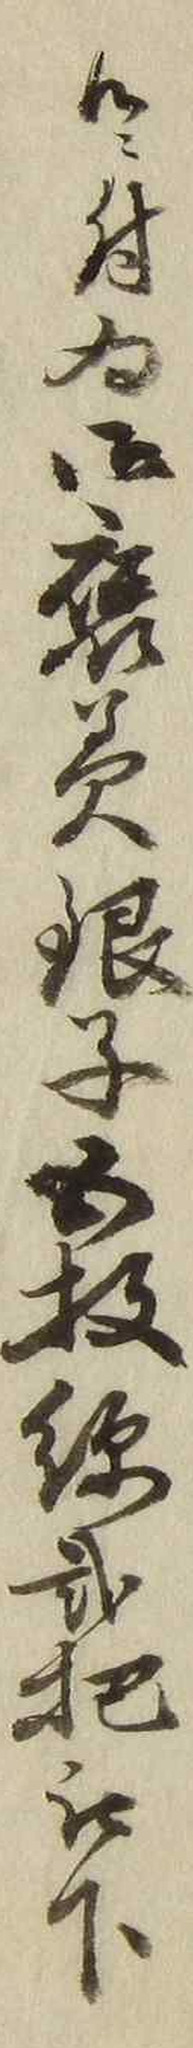候ニ付為御褒美銀子五枚綿弐把被下
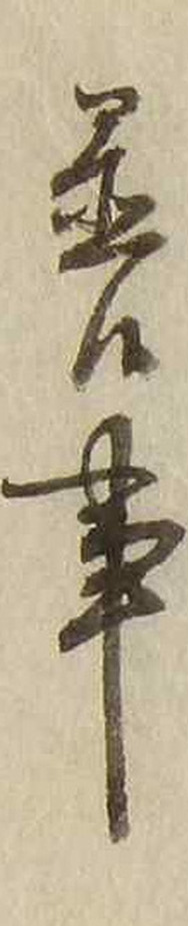置候事

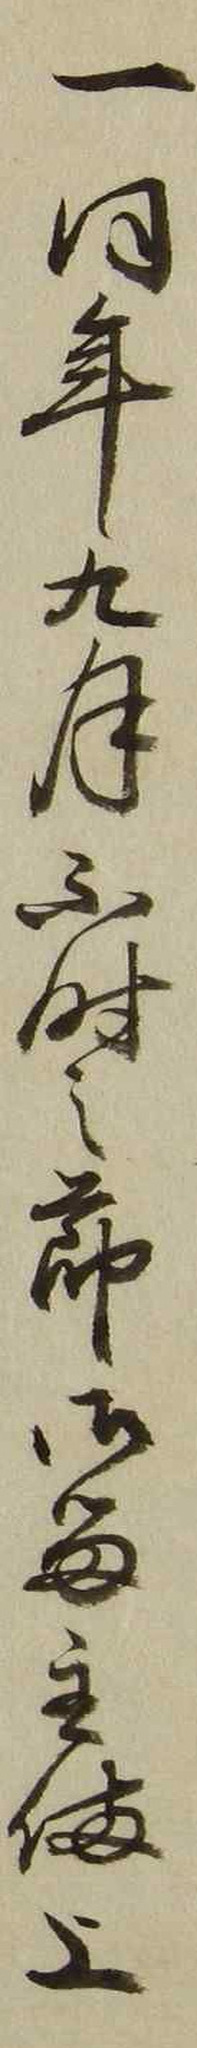一同年九月不時之節御留主備上
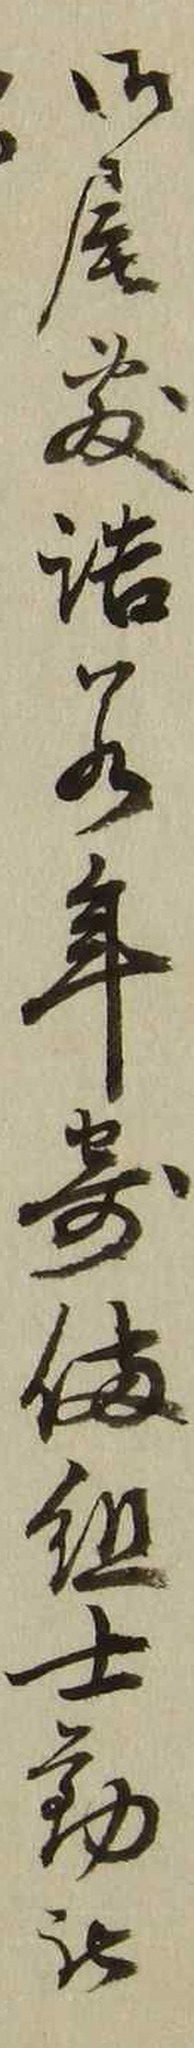御屋敷詰若年寄備組士勤被
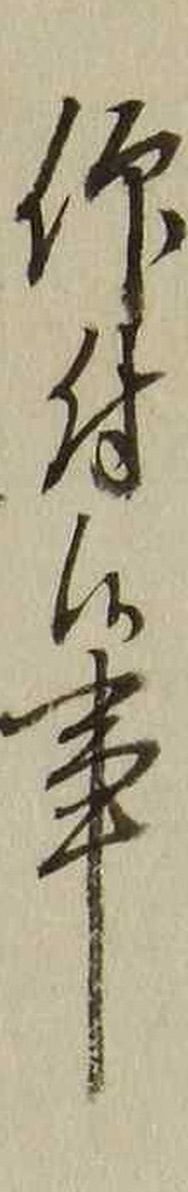仰付候事
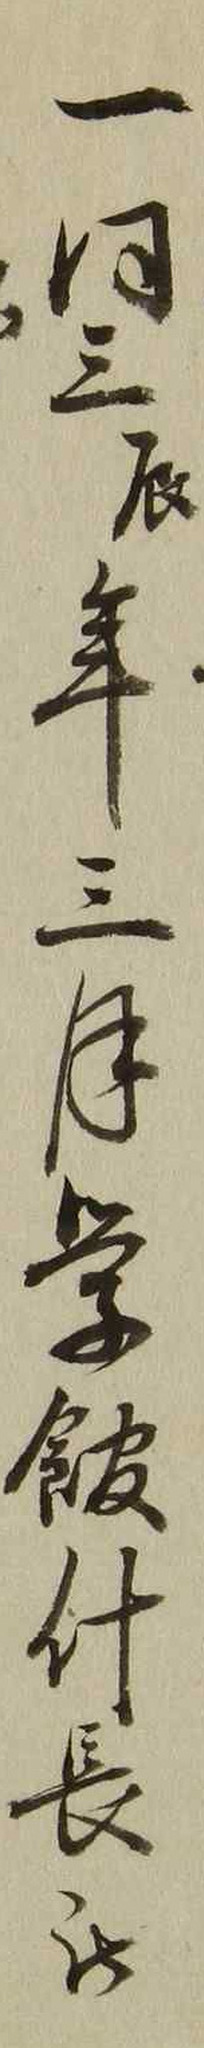一同三辰年三月学館什長被
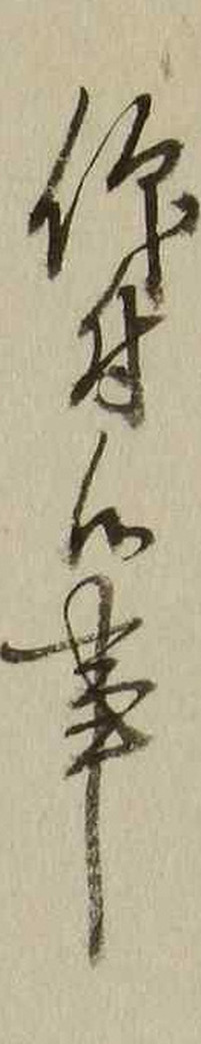仰付候事
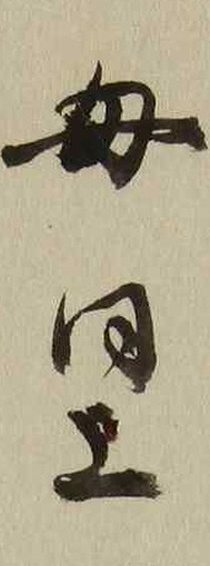母同上
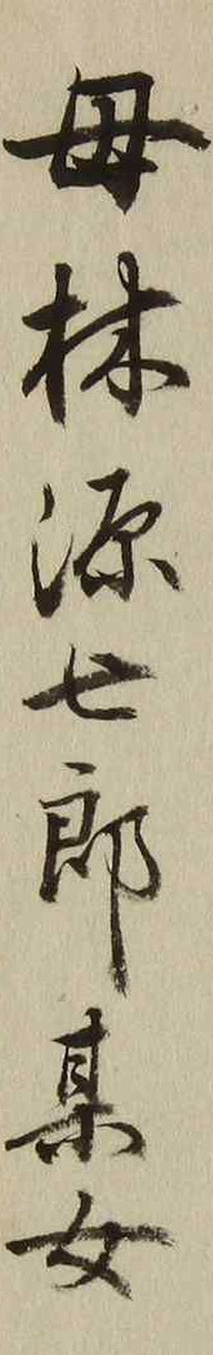母林源七郎某女
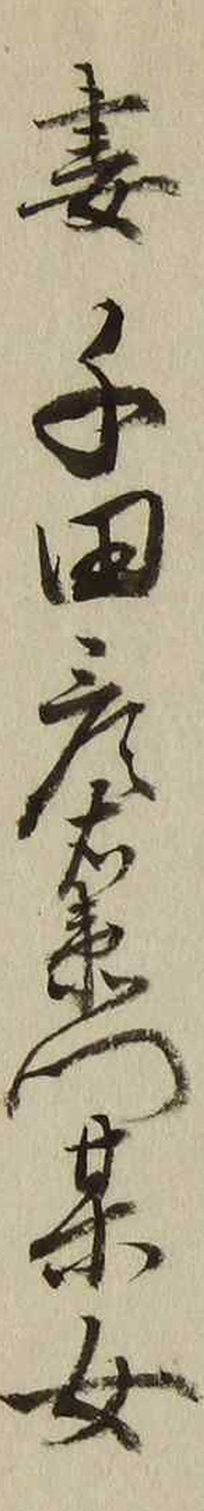妻千田彦右衛門某女
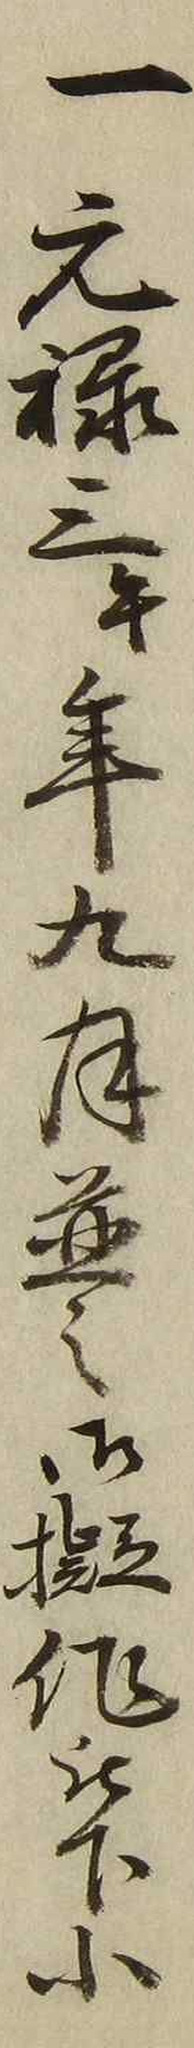一元禄三午年九月並之御擬作被下小
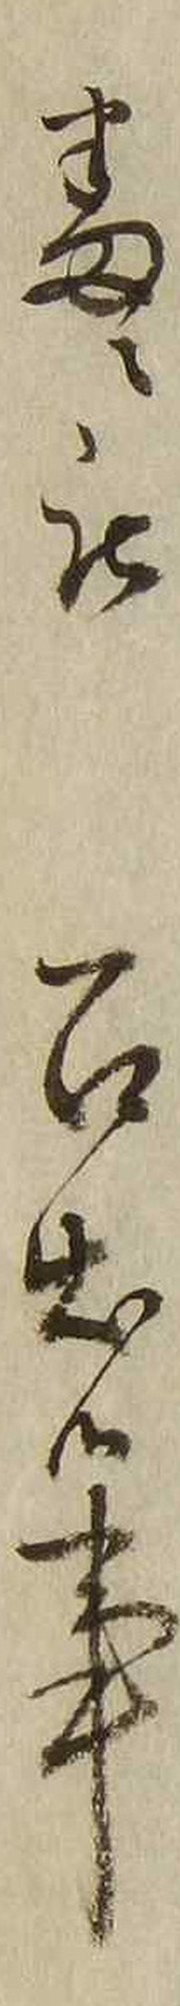番ニ被召出候事

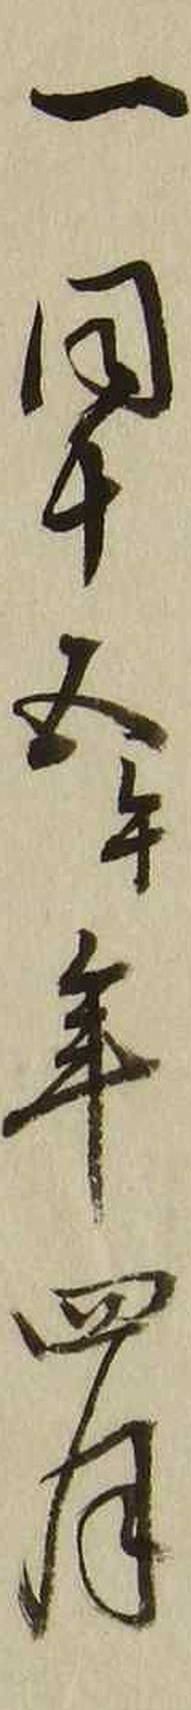一同十五午年四月
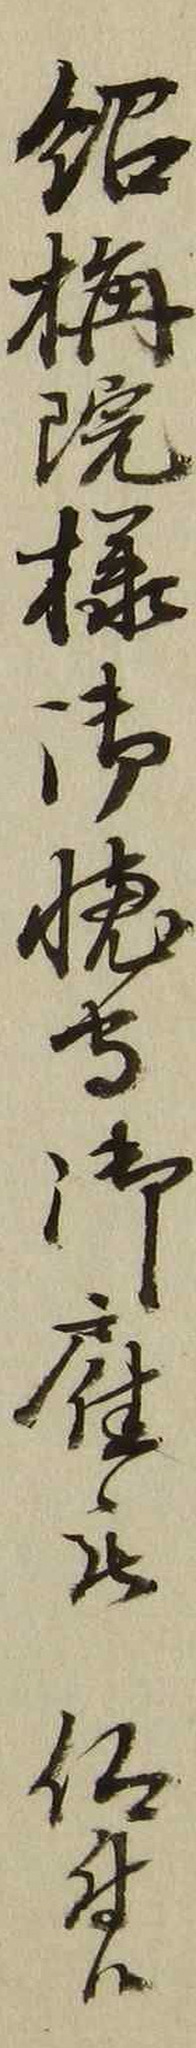紹栴院様御懐守御雇被仰付候
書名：諸士系譜　巻之35　は之部3
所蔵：会津若松市立会津図書館
